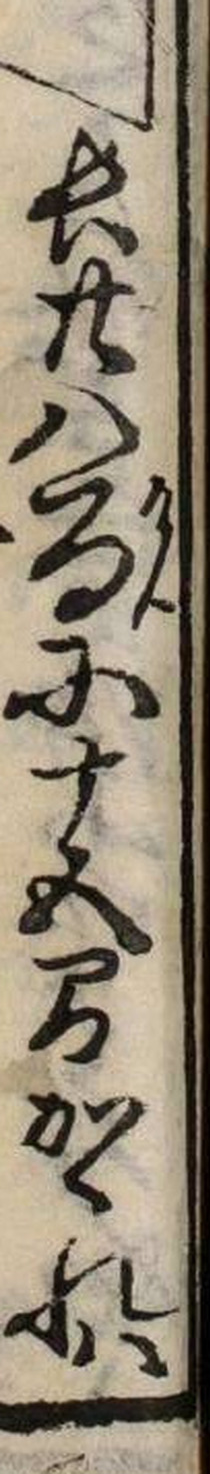長廿八間に十五間かくれは
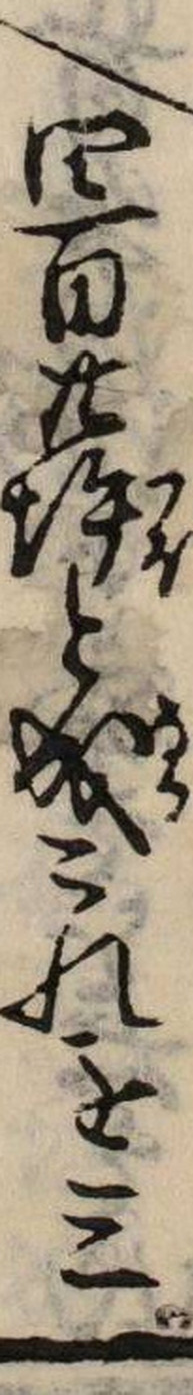四百廿坪と成これを三
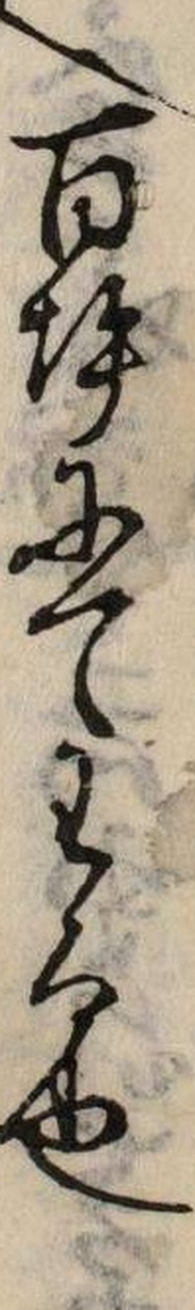百坪にてわる也
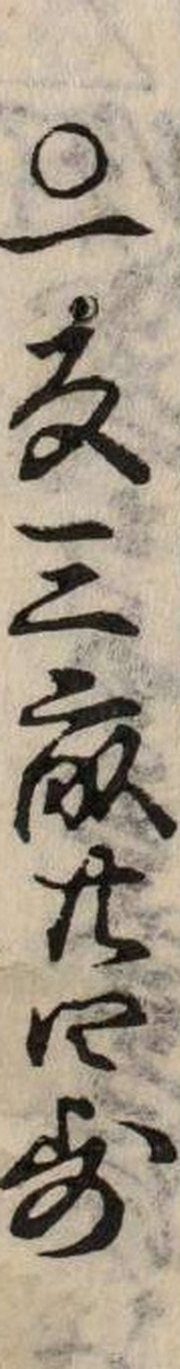○一反三畝廿四歩
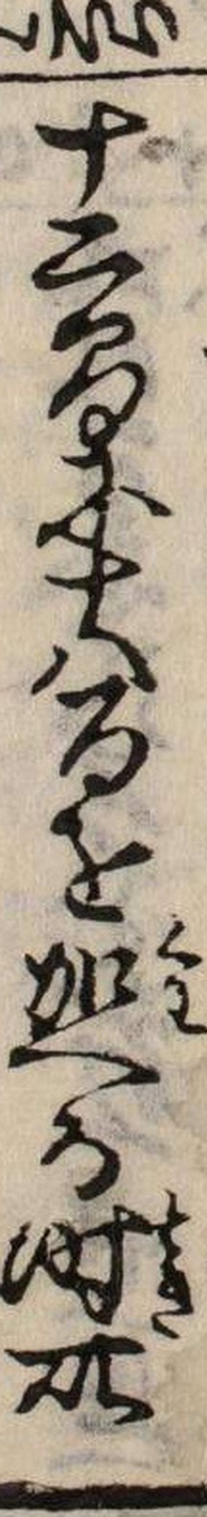十二間に十八間を加へる時丗
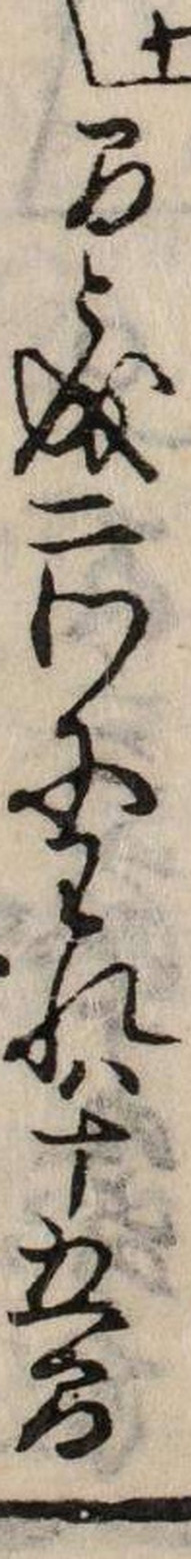間と成二つにわれは十五間
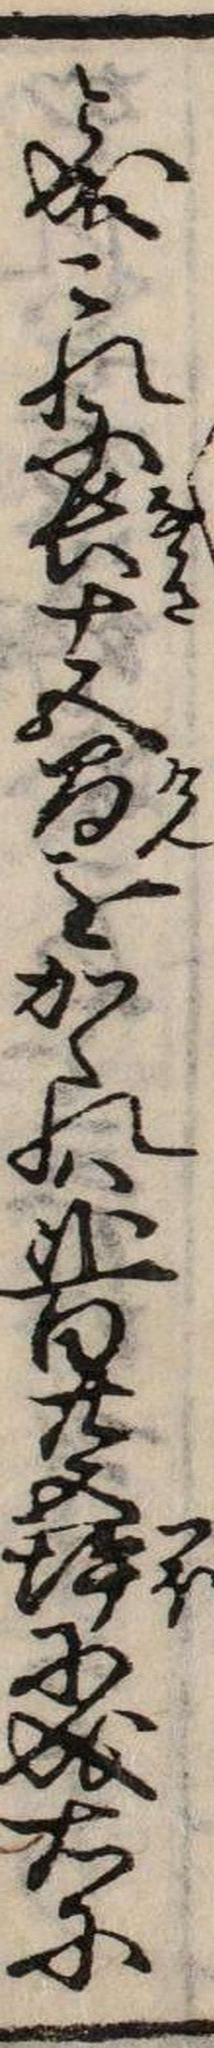と成これに長十五間をかくれは弐百廿五坪に成右に
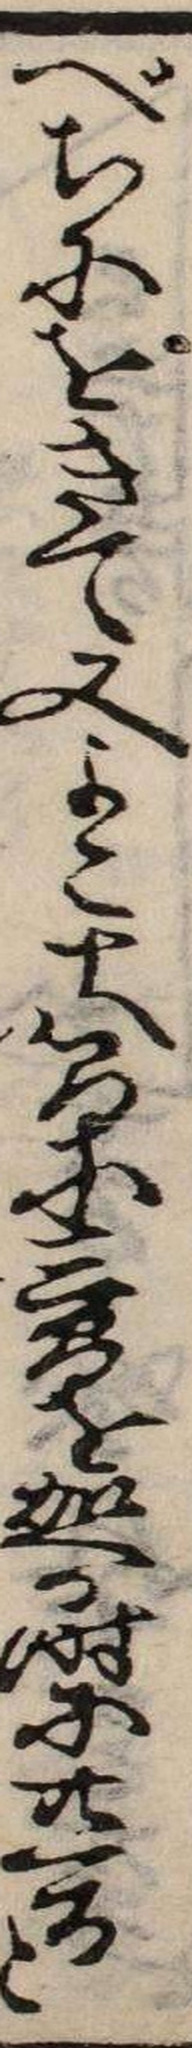べちにをきて又よこ十八間に三間を加へる時に廿一間と
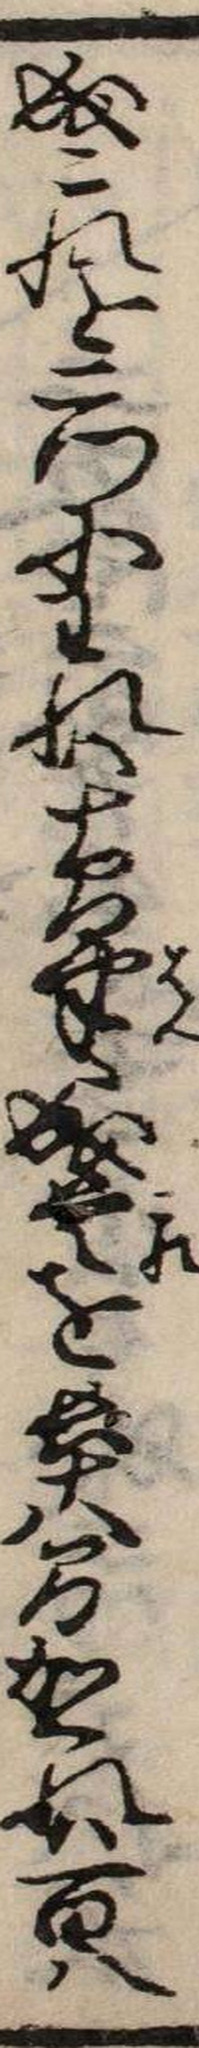成これを二つにわれは十間半に成是を長十八間かくれは百八
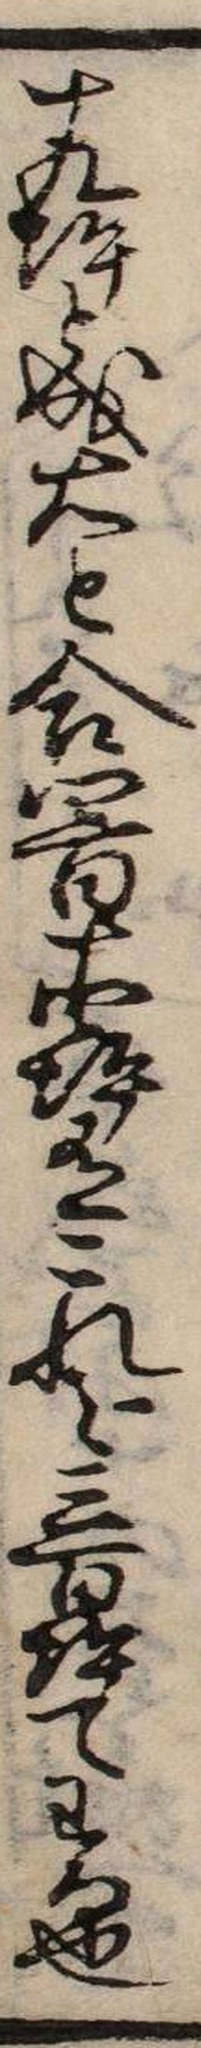十九坪と成右と合四百十四坪有これを三百坪てわる也

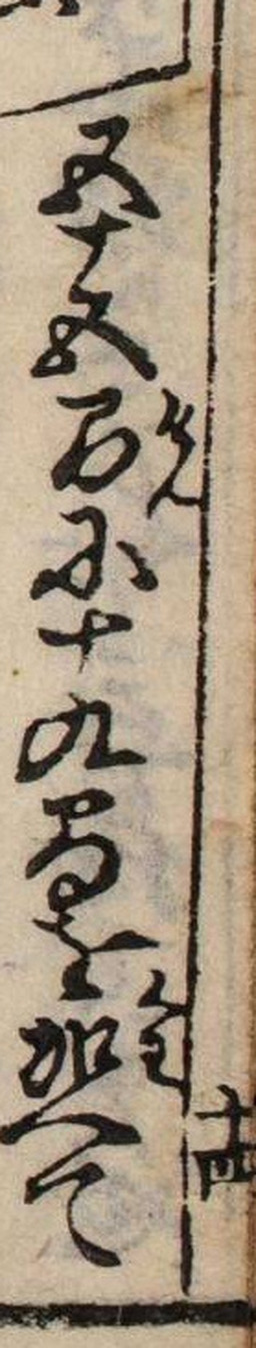五十五間に十九間を加へて
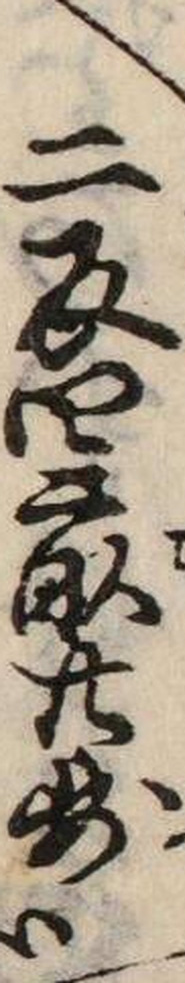二反四畝廿歩
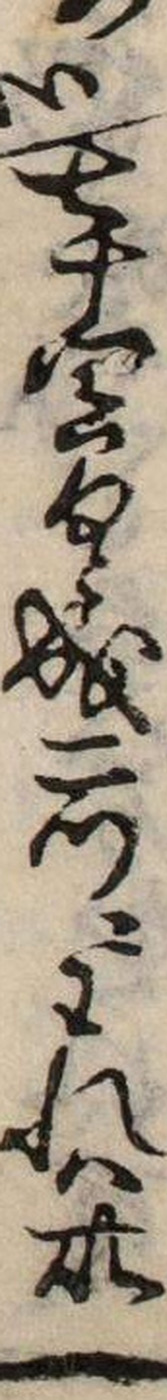七十四間と成二つにわれは卅
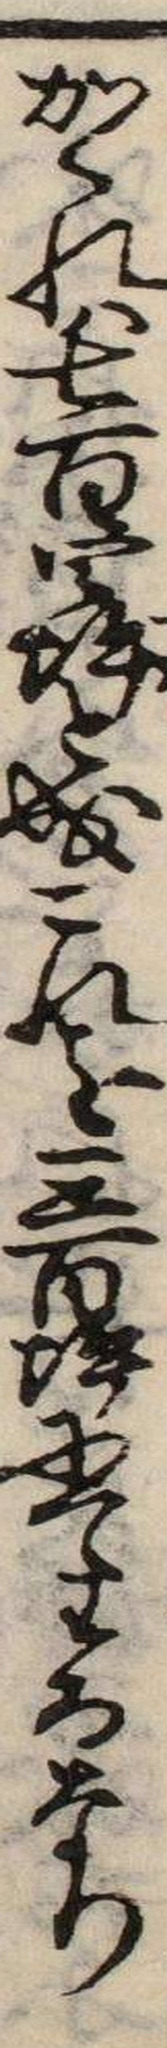かくれは七百四十坪と成これを三百坪にてわるなり
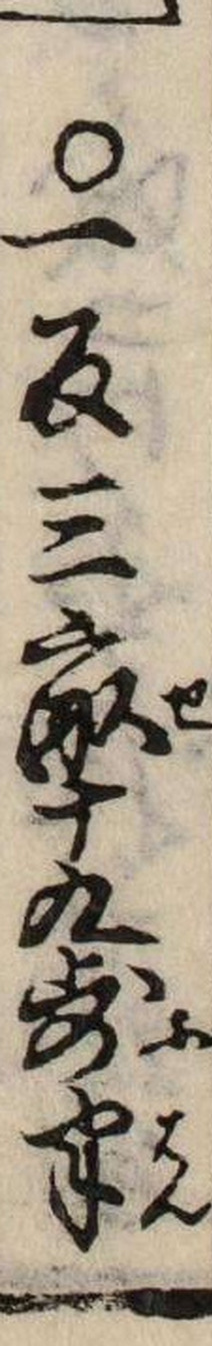○一反三畝十九歩半
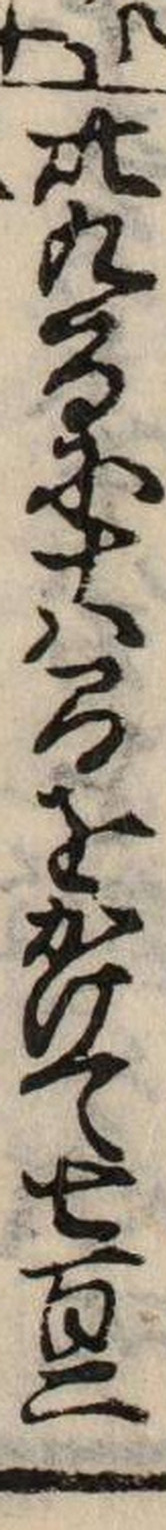卅九間に十八間をかけて七百二
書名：塵劫記（寛永11年自跋、京都府立京都学・歴彩館追貴8）
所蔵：京都府立京都学・歴彩館 国文学研究資料館
